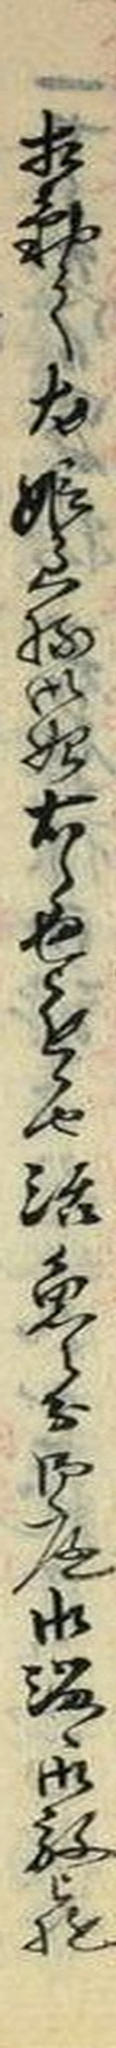相勤之尤姫君様御始右之通被進候由活魚之分御庭御溜へ御放被遊
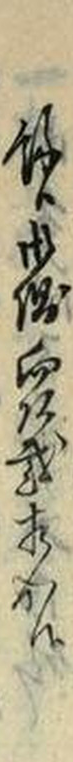餘ハ御側向頂戴相成候
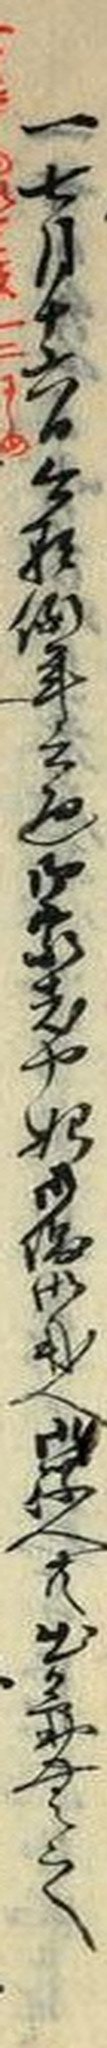一七月十六日今朝例年之通御家老中始御側御用人御役人共出勤無之
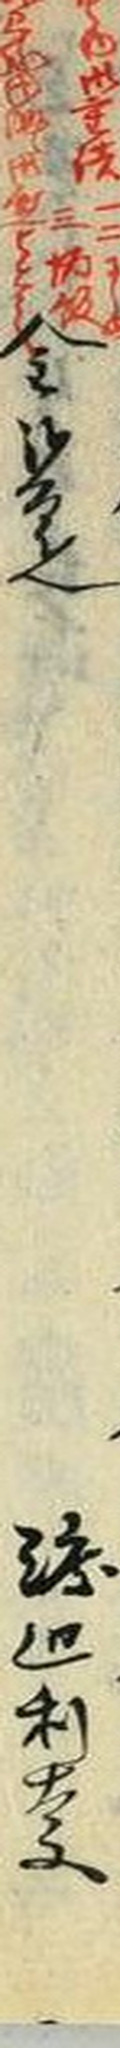金弐百疋渡辺利太夫
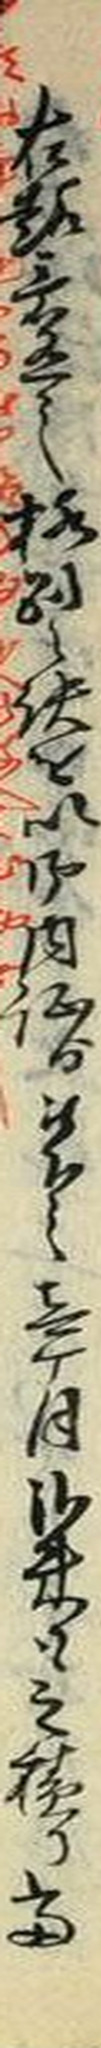右趣意有之格別之訳を以御内証ゟ被下之壱ヶ月弐朱ツヽ之積り当
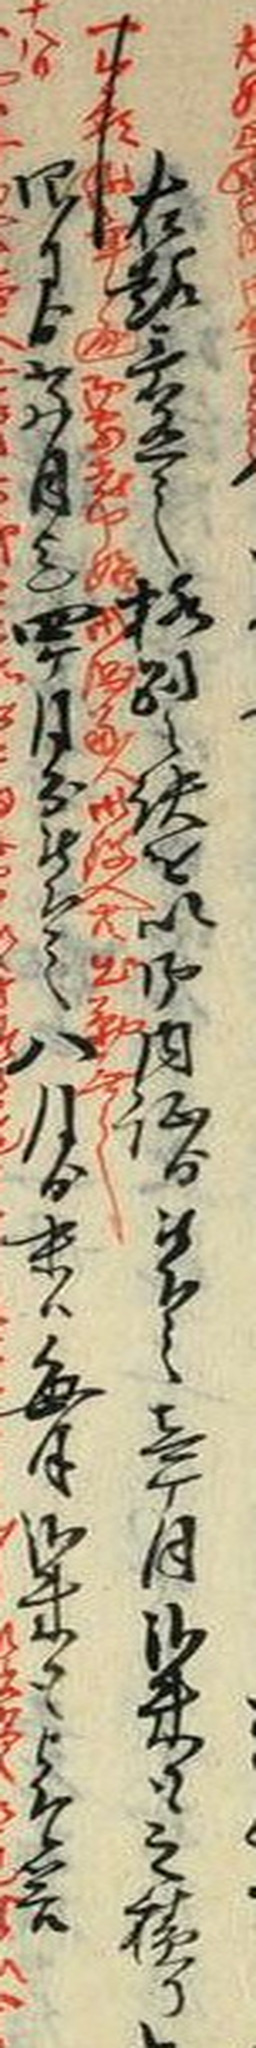四月ゟ当月迄四ヶ月分被下之八月ゟ末ハ毎月弐朱ツヽ被下候筈
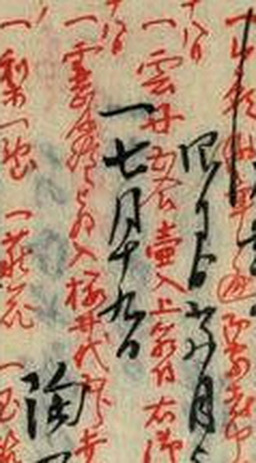一七月十九日
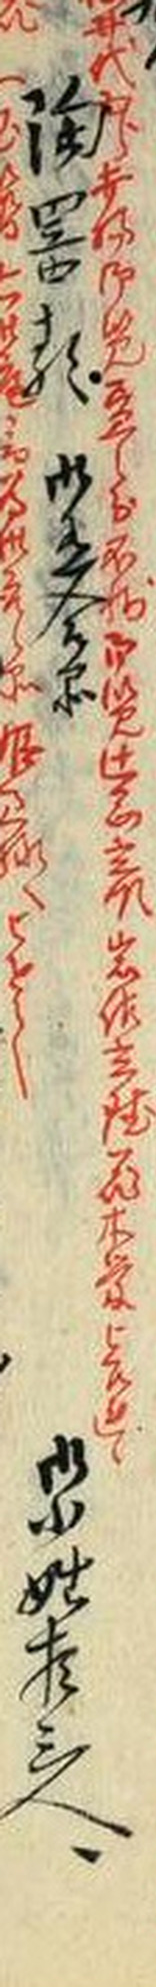陶器類御有合品御小姓拾三人へ
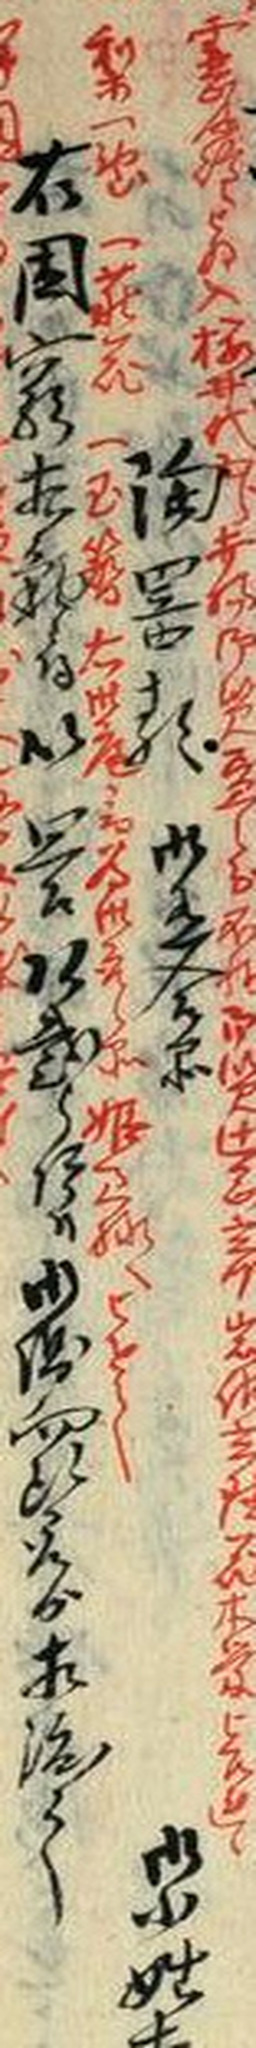右困窮相勤候ニ付以思召頂戴被仰付御側向頭ゟ相渡之
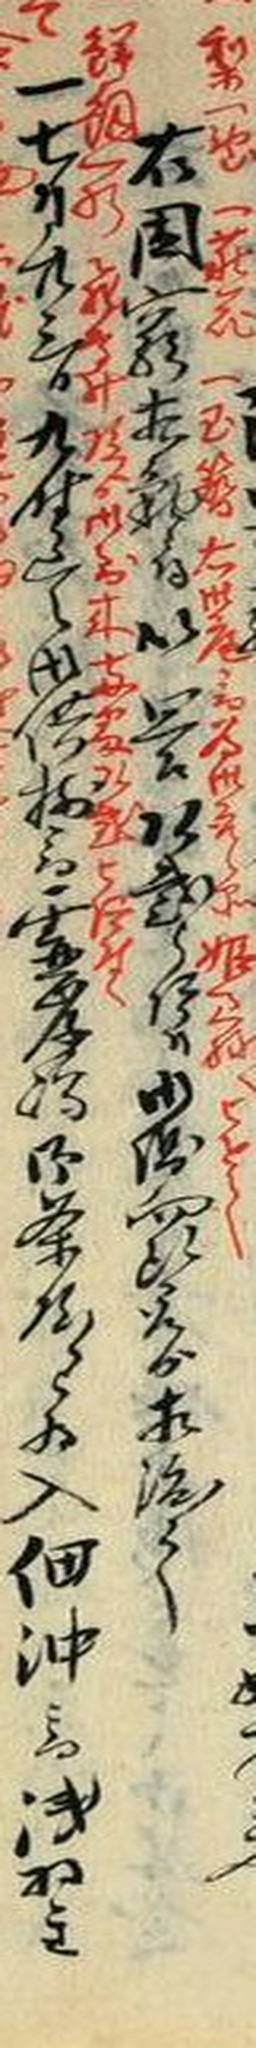一七月廿三日九時過之御供揃ニ而霊岸嶋御茶屋へ被為入佃沖ニ而浅羽主
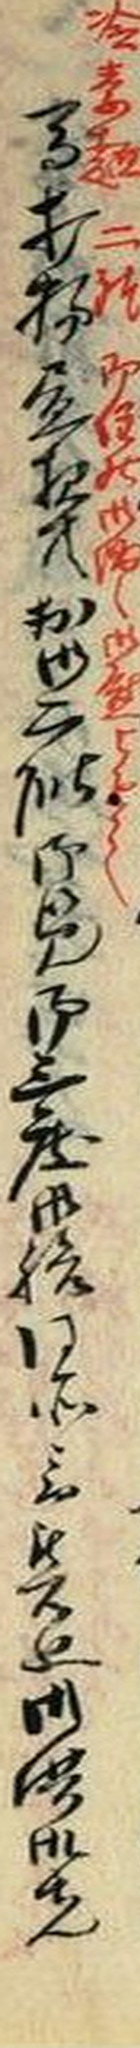馬打揚昼夜共於御二階御覧御三度御膳同所ニ而被召上御供御先

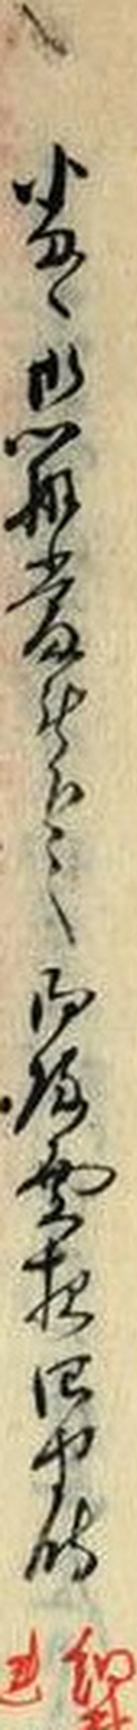番へ御弁当被下之御帰殿夜四半時
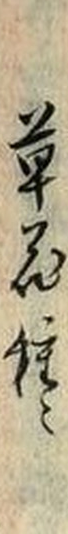草花種々
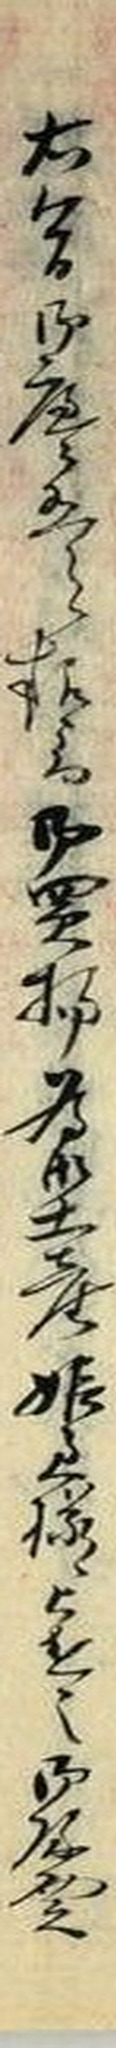右今日御庭ニ有之趣ニ而御買揚為御土産姫君様へ被進之御帰殿
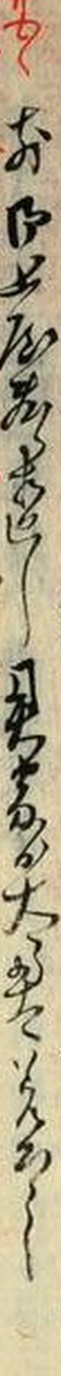前御上屋敷へ相廻し奥番ゟ大奥へ差出之
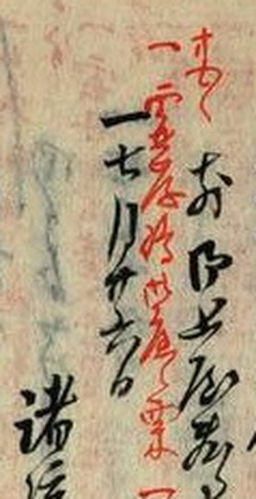一七月廿六日
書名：少傅日録抄（斉承付側向頭取日記、在府）
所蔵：福井県文書館 Fukui Prefectural Archives
